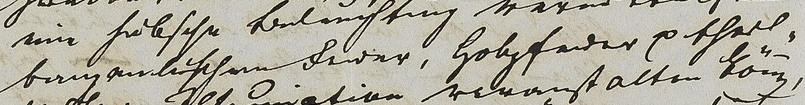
banganlischem Feuer, Holzfeuer & theil-
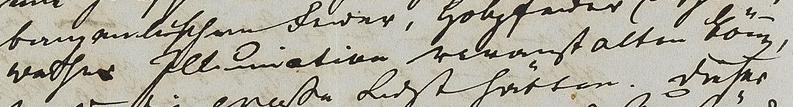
weiser Illumiation veranstalten können,
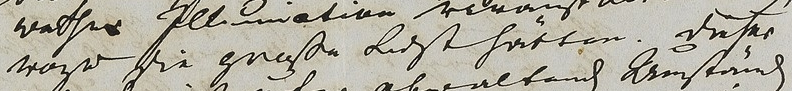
wozu sie große Lust hätten. Dieser
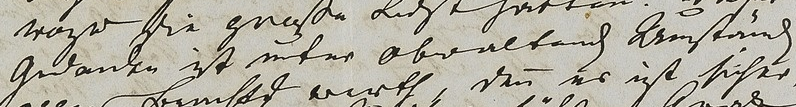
Gedanke ist unter obwaltenden Umständen
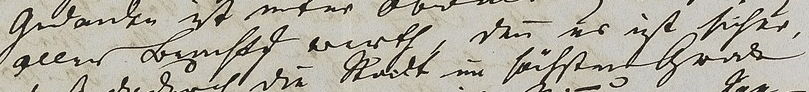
aller Beachtung werth, denn es ist sicher,
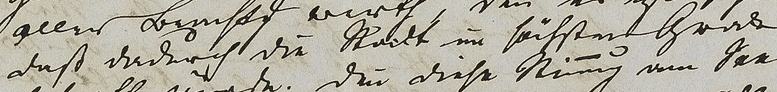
daß dadurch die Stadt im höchsten Grade
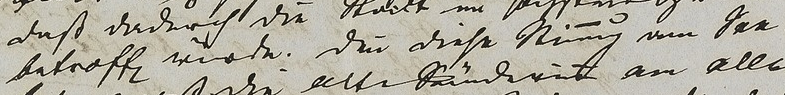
betroffen würde. Denn diese Stimmung vom See –
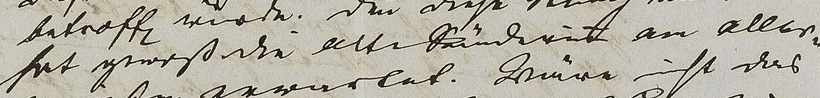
hat gewiß die alte Sünderinn am aller-
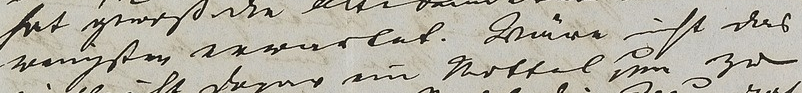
wenigsten erwartet. Wäre nicht das
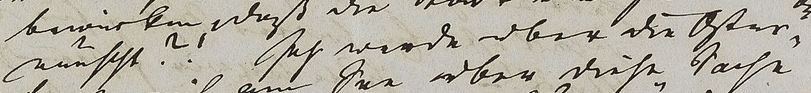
wünscht?! Ich werde über die Oster -
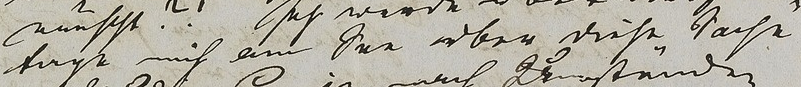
tage mich am See über diese Sache
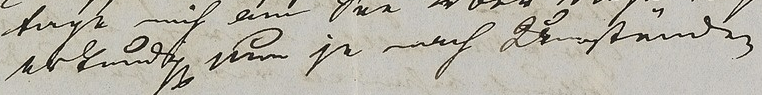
erkundigen, um je nach Umständen
